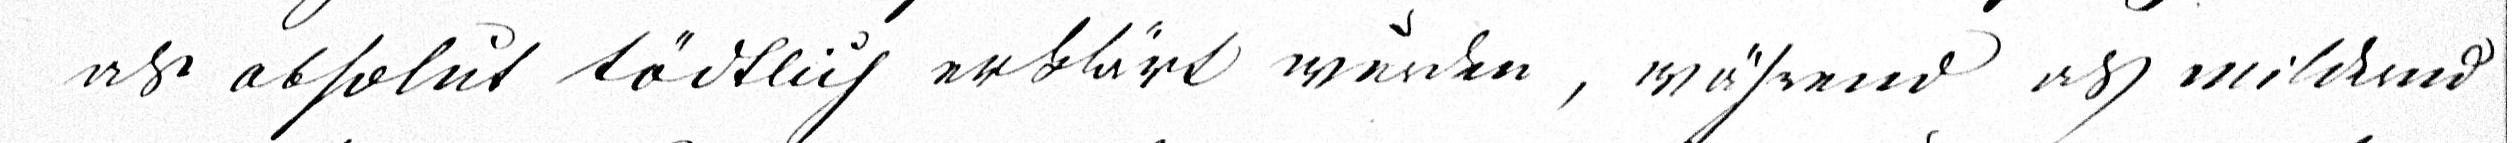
als absolut tödtlich erklärt wurden, während als mildernd
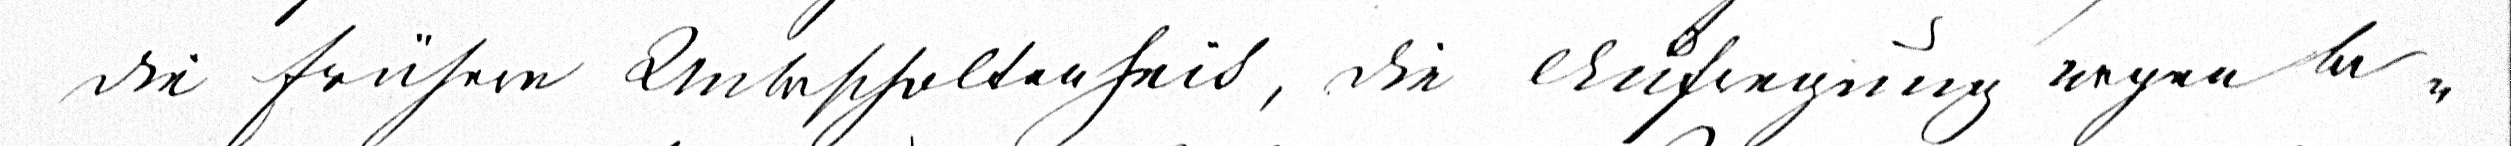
die frühern Unbescholtenheit, die Aufregung wewgen be¬
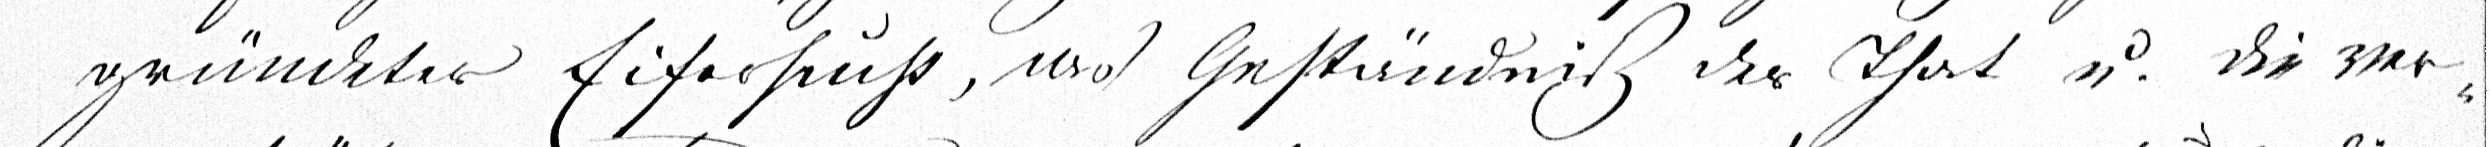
gründeter Eifersucht, das Geständnis der That u. die ver¬
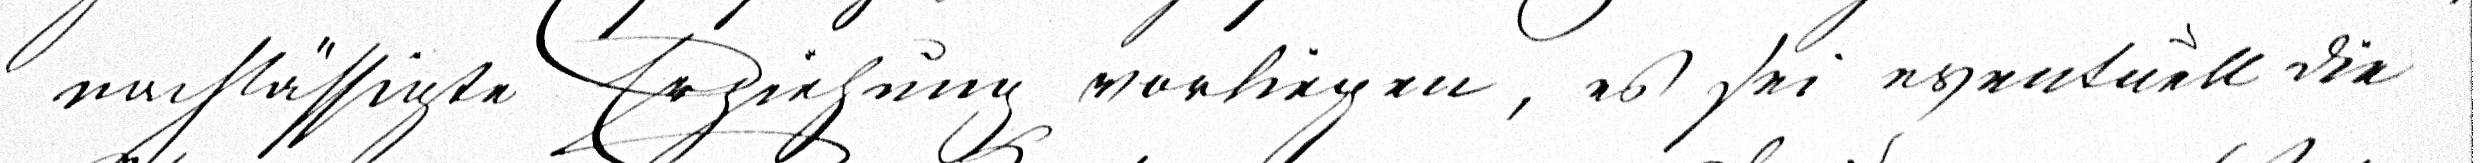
nachlässigte Erziehung vorliegen, es sei eventuell die
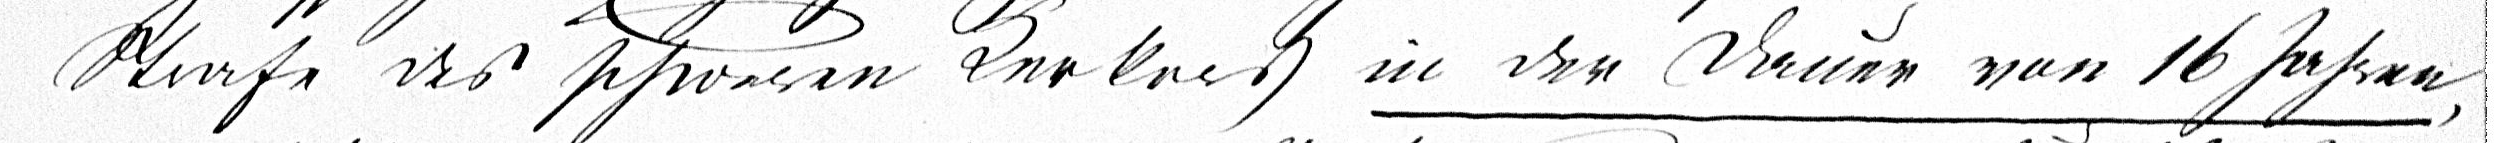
Strafe des schweren Kerkers in der Dauer von 16 Jahren,
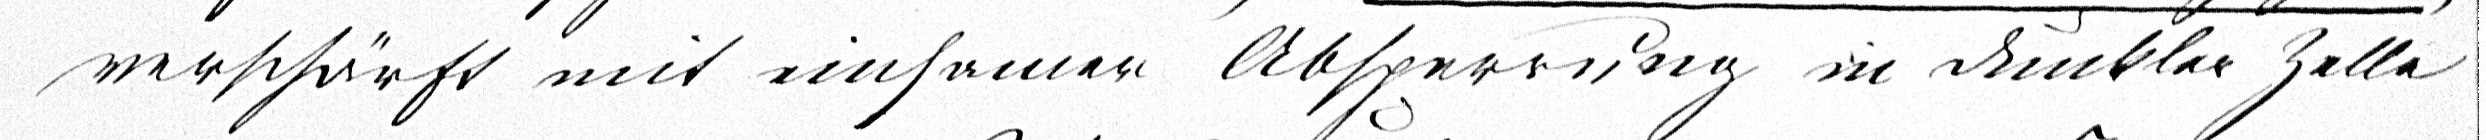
verschärft mit einsamen Absperrung in Dunkler Zelle
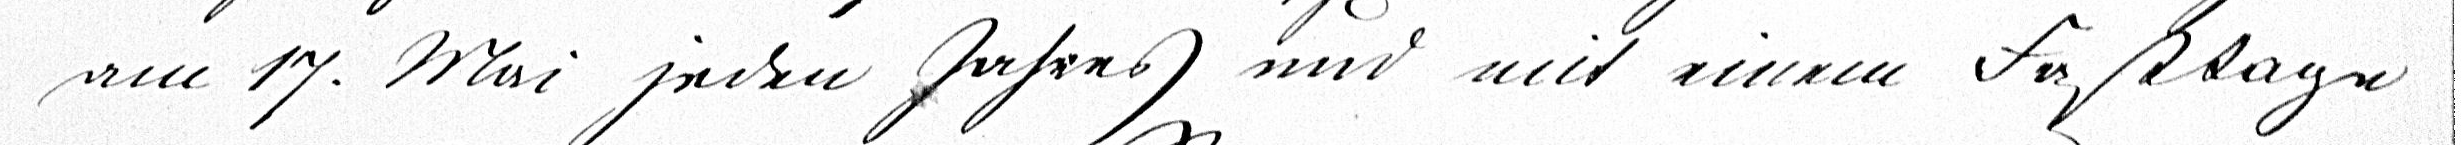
am 17. Mai jeden Jahres und mit einem Fasttage
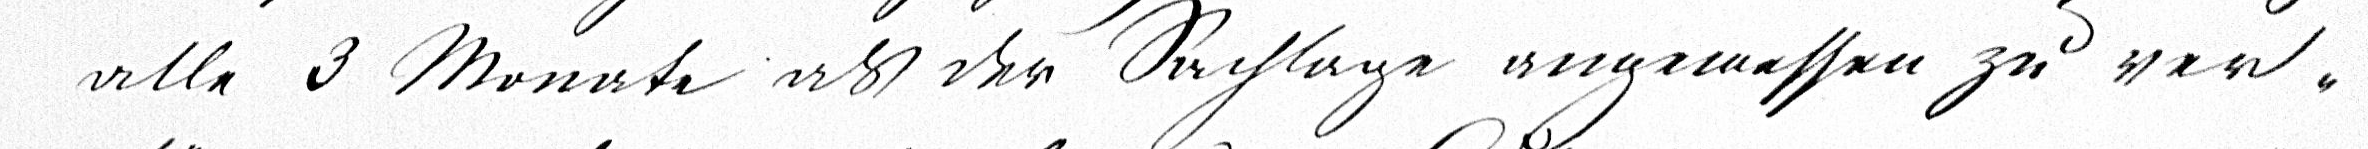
alle 3 Monate als der Sachlage angemessen zu ver¬
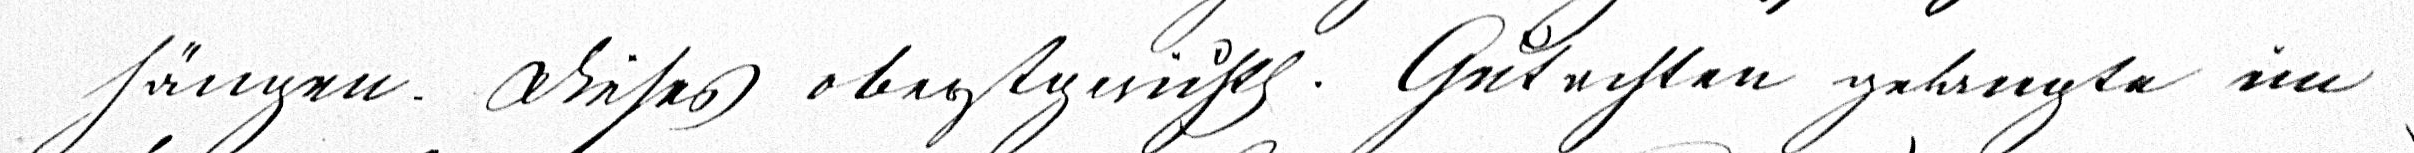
hängen. Dieses oberstgericht. Gutachten gelangte im
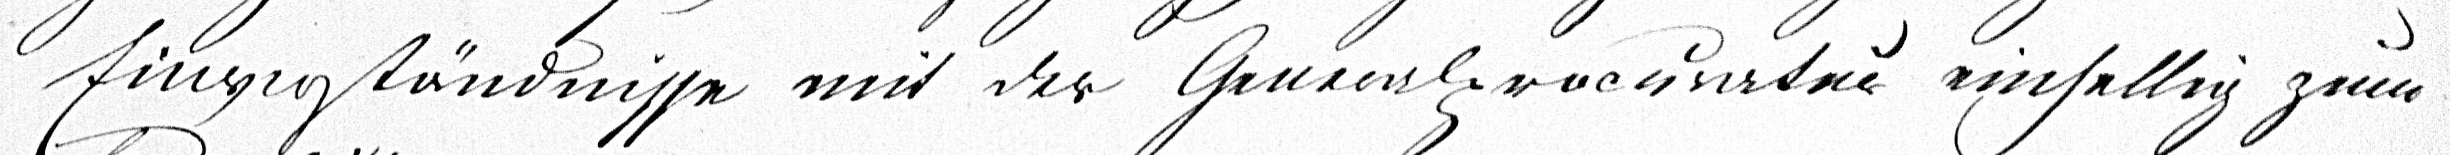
Einverständnisse mit der Generalprocuratur einhellig zum
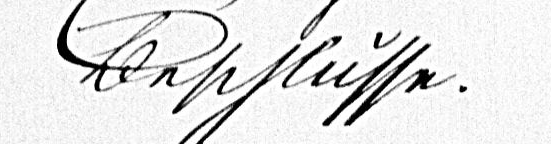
Beschlusse.
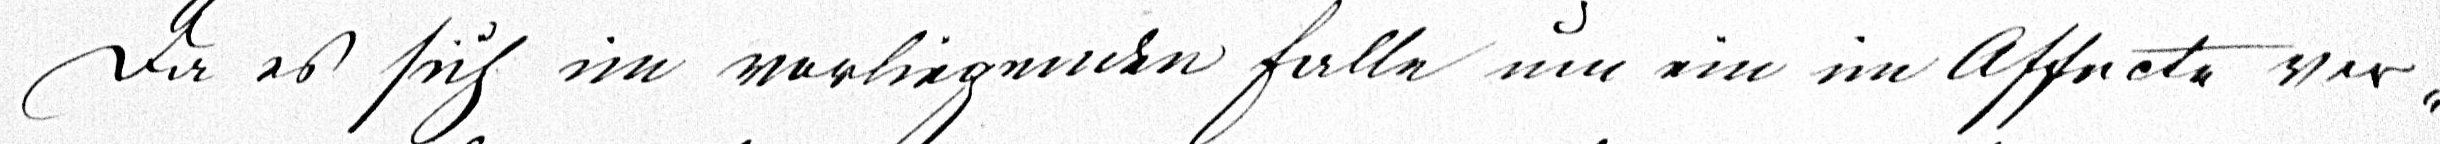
Da es sich im vorliegenden Falle um ein im Affecte ver¬
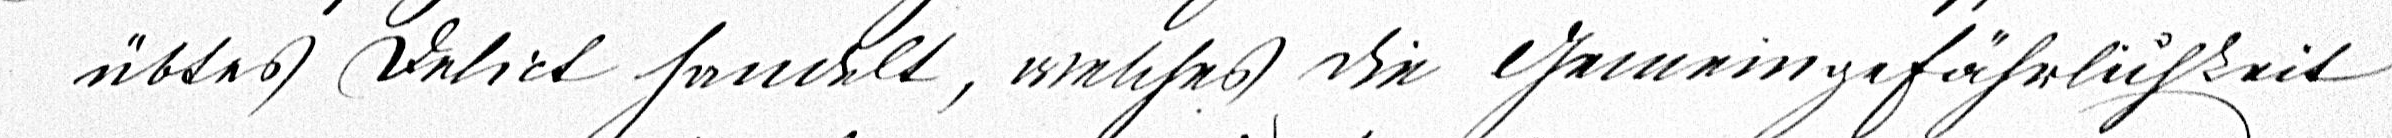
übtes Delict handelt, welches die Gemeingefährlichkeit
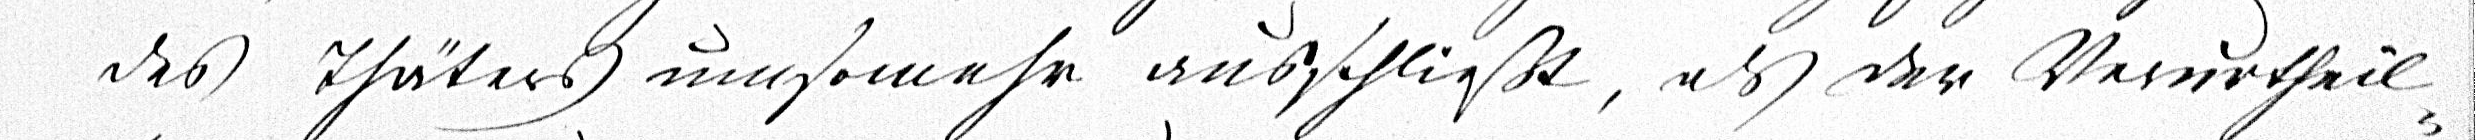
des Thäters umsomehr ausschlißt, als der Verurtheil¬
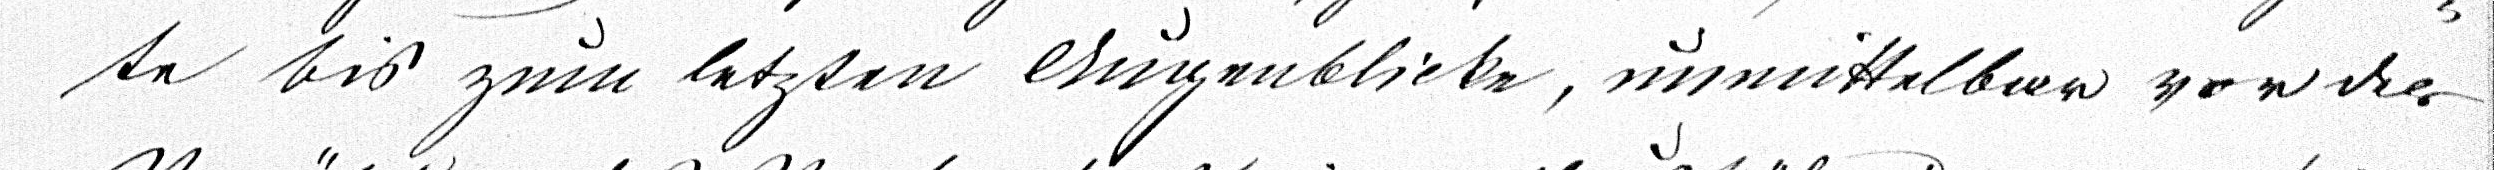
te bis zum letzten Augenblicke, unmittelbar von der
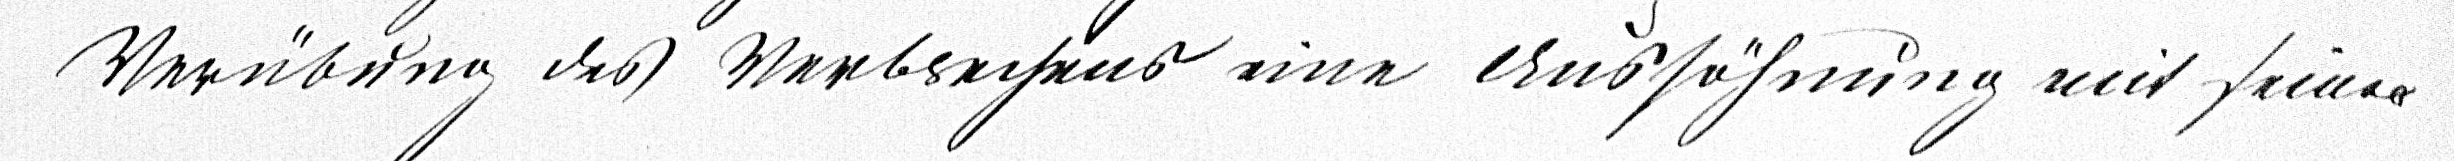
Verübung des Verbrechens eine Aussöhnung mit seiner
